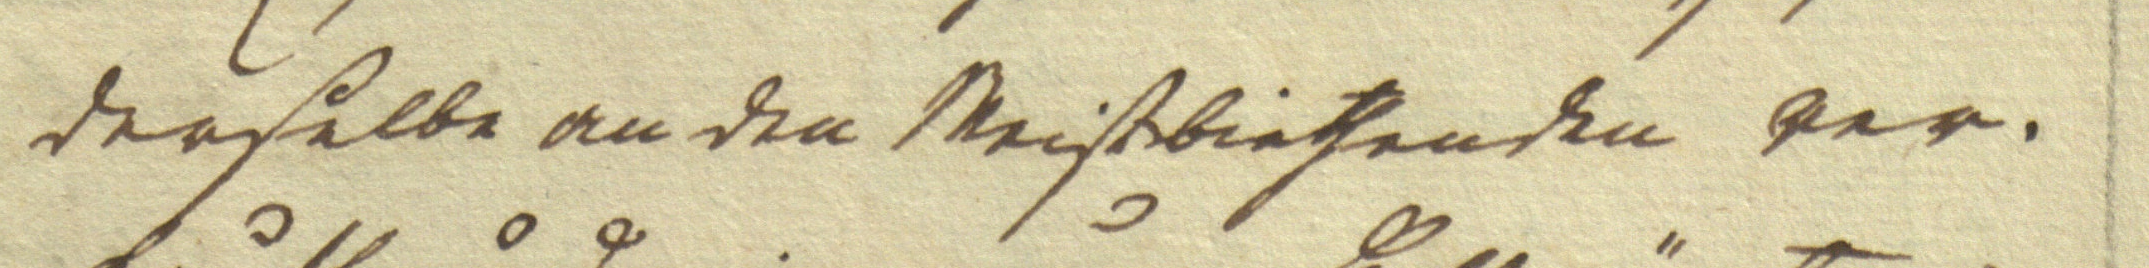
derselbe an den Meistbiethenden ver¬
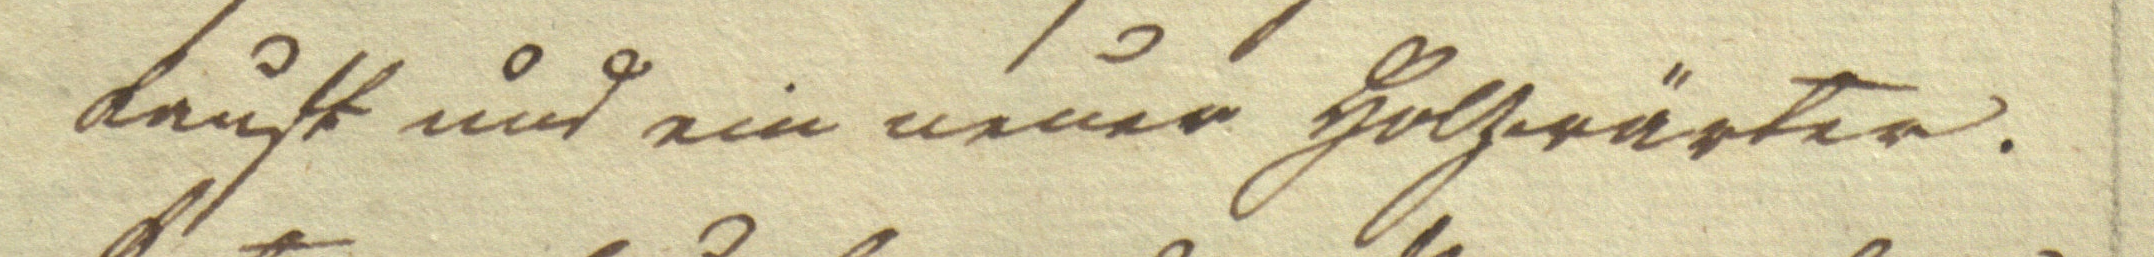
kauft und ein neuen Holzwärter¬
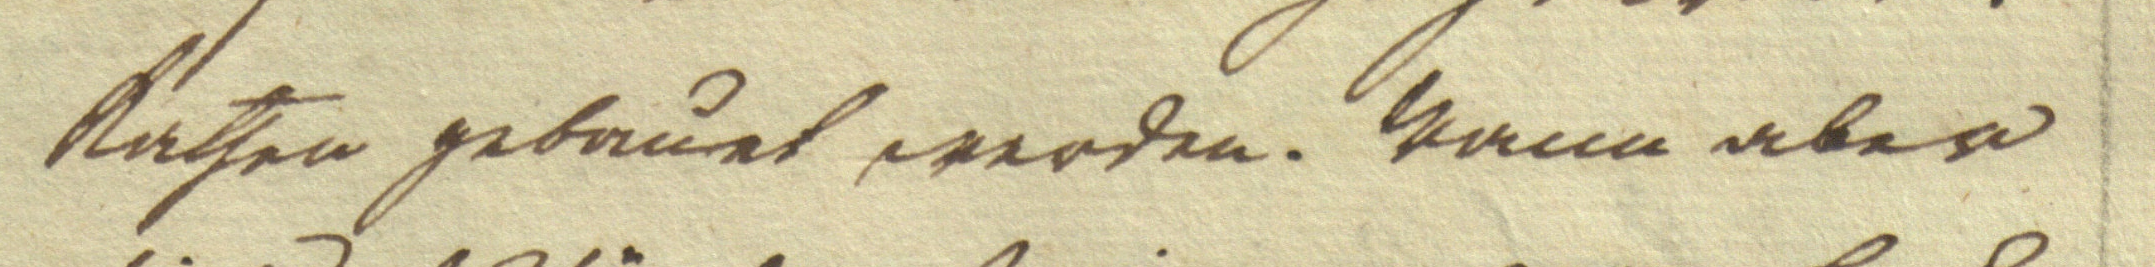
Kathen gebauet werden. Wann aber
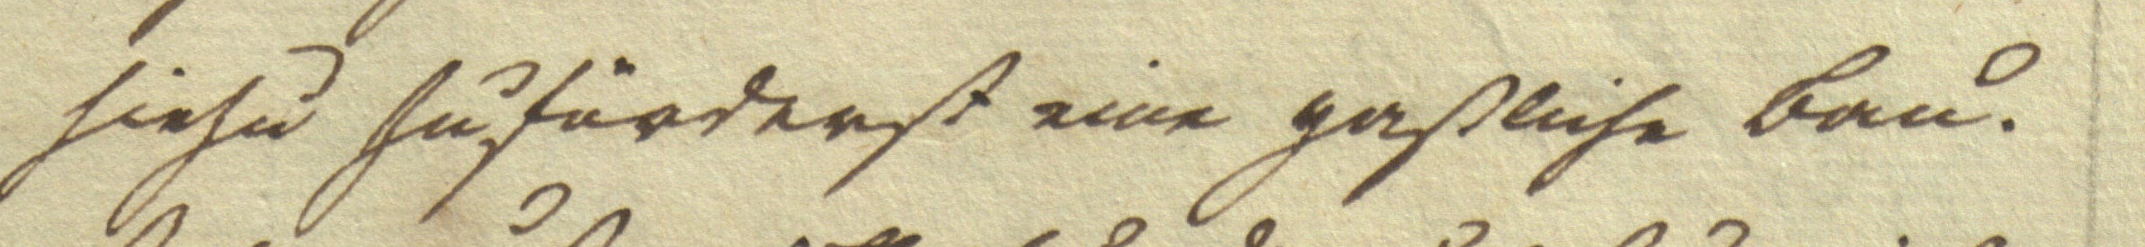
hiezu zuförderst eine paßliche Bau¬
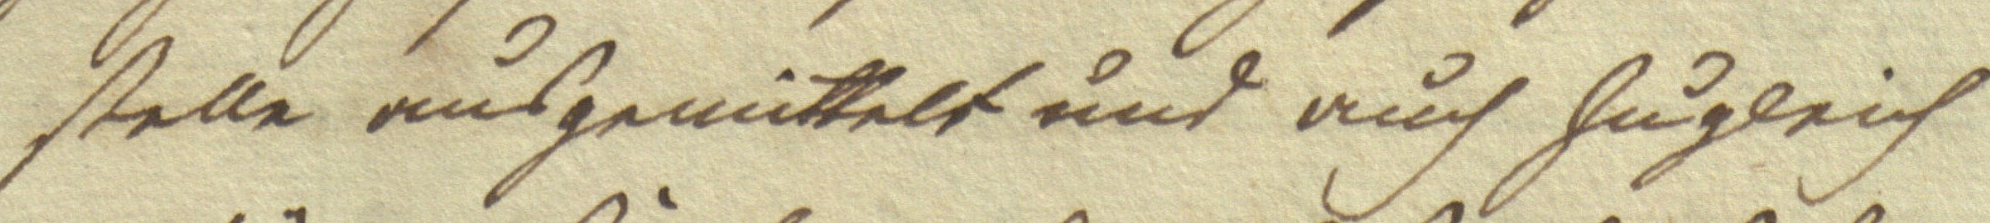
stelle ausgemittelt und auch zugleich
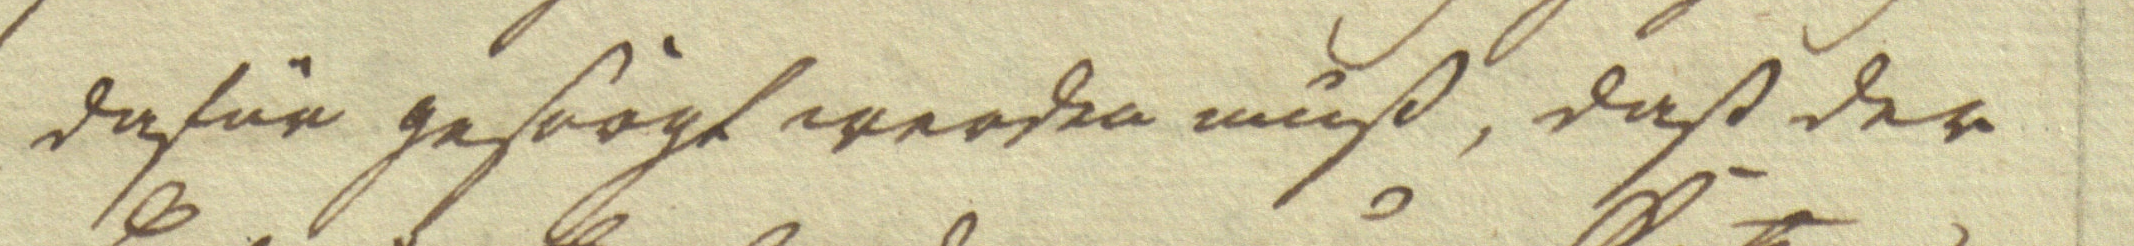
dafür gesorgt werden muß, daß der
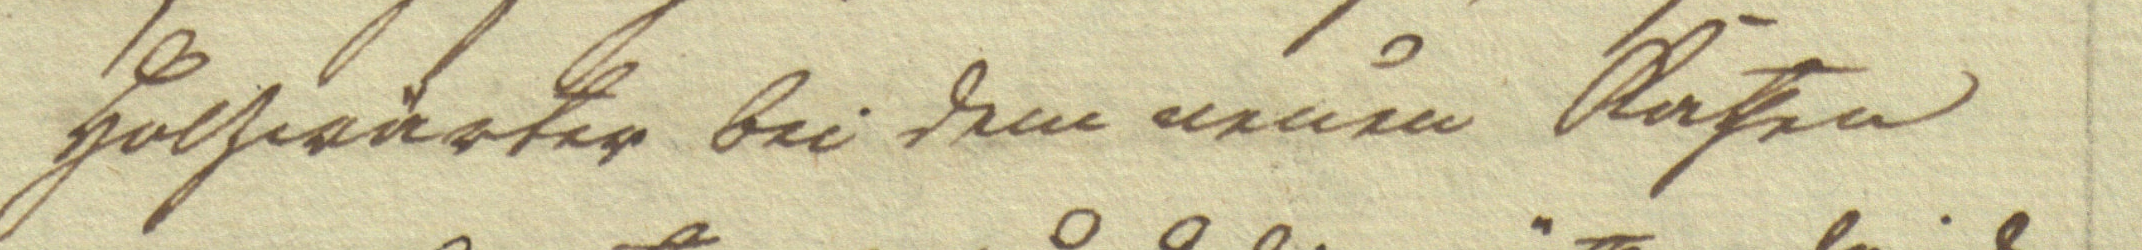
Holzwärter bei dem neuen Kathen
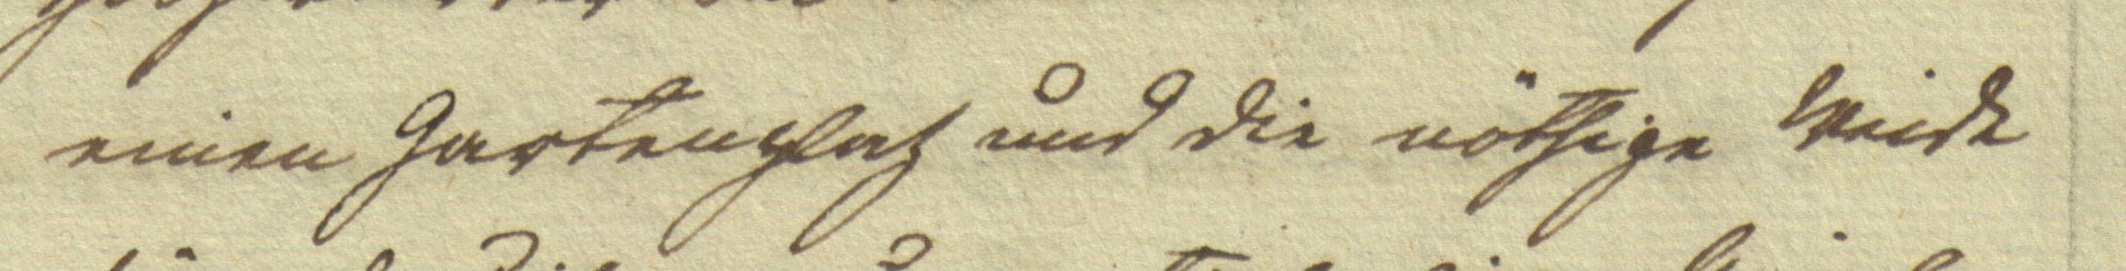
einen Gartenplaz und die nöthige Weide
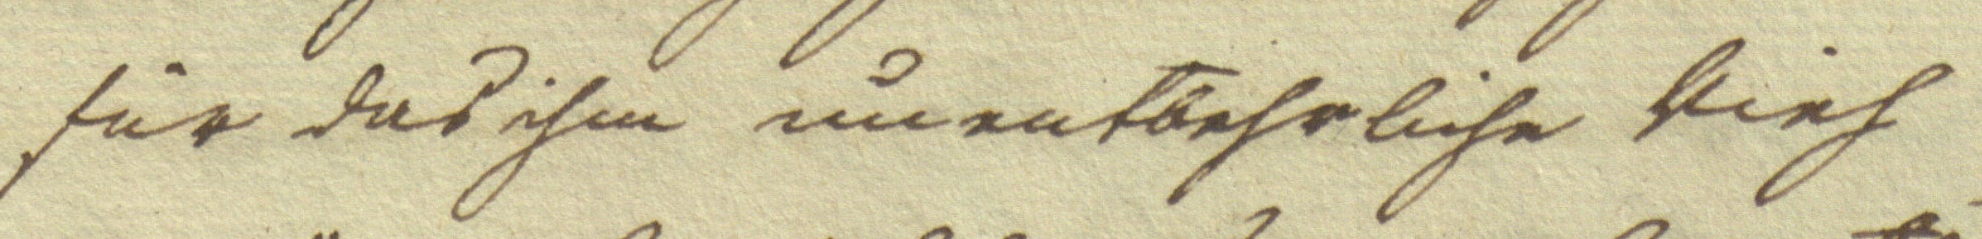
für das ihm unentbehrliche Vieh
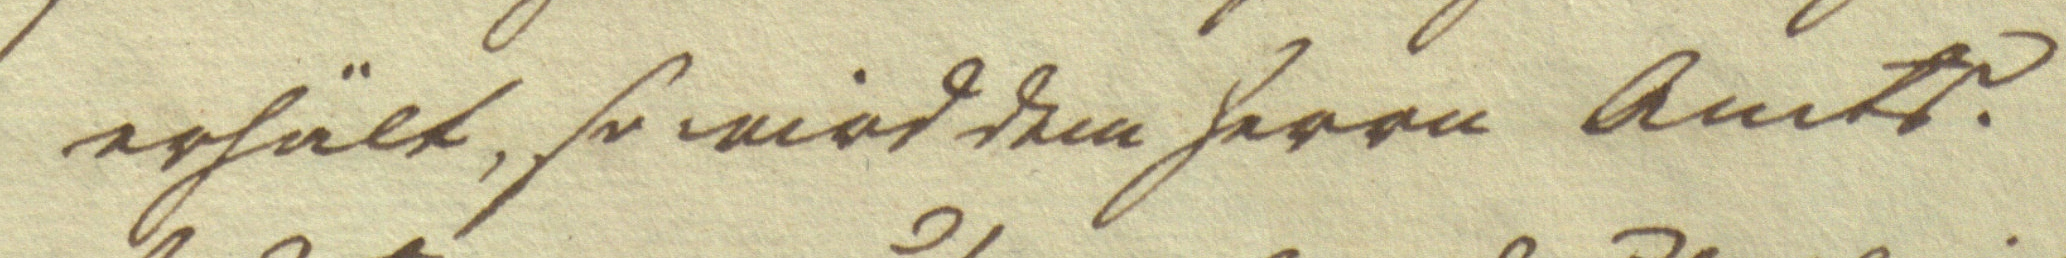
erhält, so wird dem Herrn Amts¬
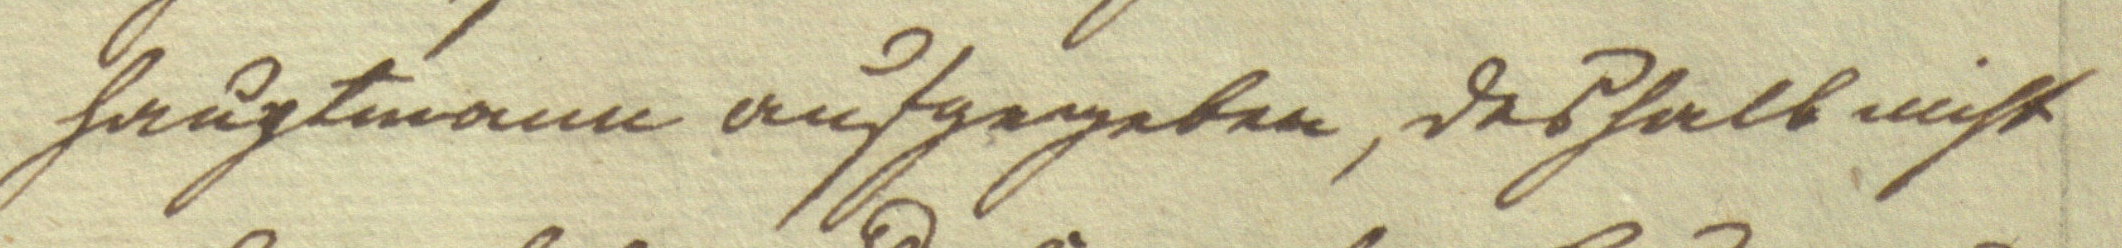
hauptmann aufgegeben, deshalb nicht
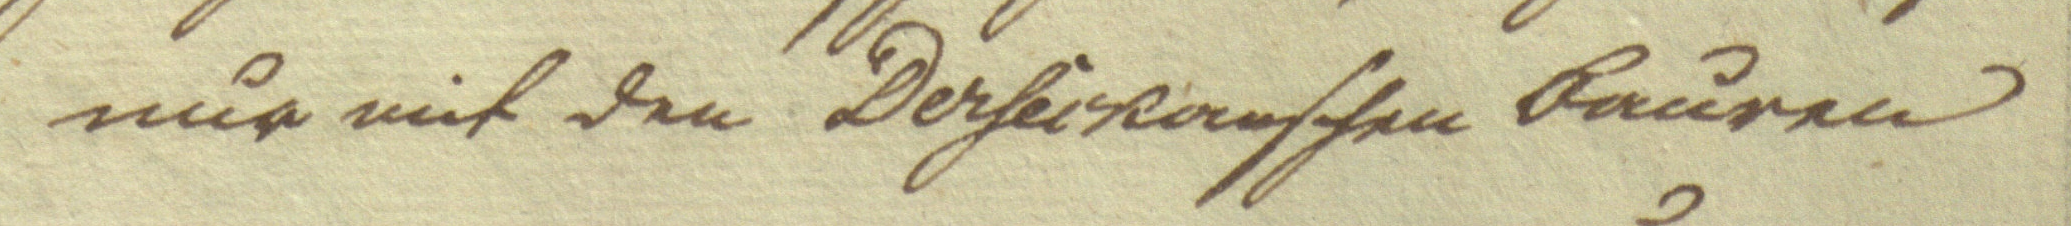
nur mit den Derseckowschen Bauren
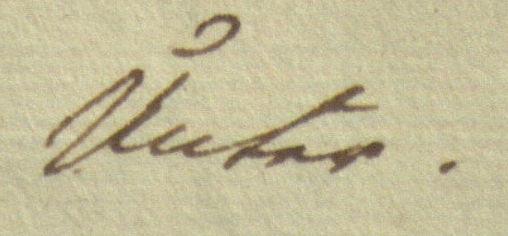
Unter¬
